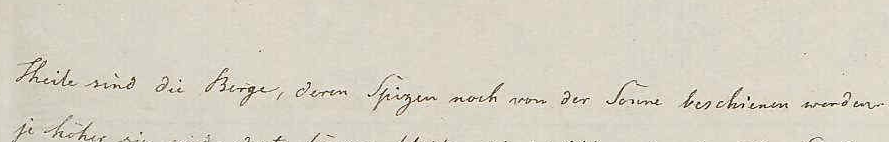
Theile sind die Berge, deren Spizen noch von der Sonne beschienen werden:
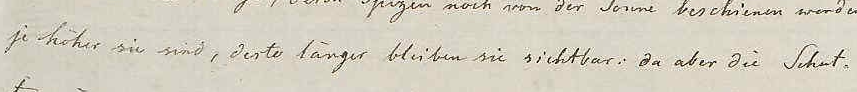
je höher sie sind, desto länger bleiben sie sichtbar: da aber die Schat-
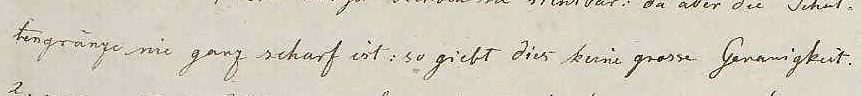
tengränze nie ganz scharf ist: so giebt dies keine grosse Genauigkeit.
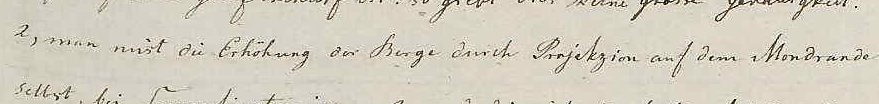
2, man mist die Erhöhung der Berge durch Projekzion auf dem Mondrande
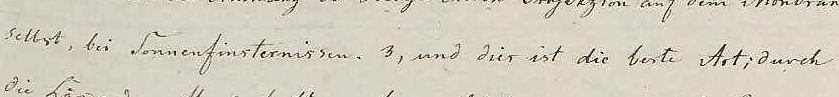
selbst, bei Sonnenfinsternissen. 3, und dies ist die beste Art; durch
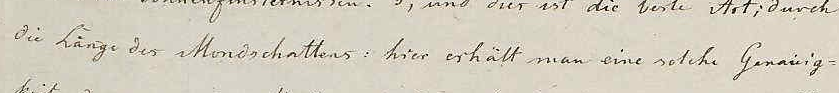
die Länge des Mondschattens: hier erhält man eine solche Genauig-
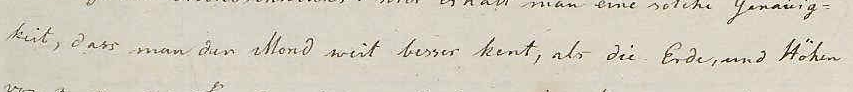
keit, dass man den Mond weit besser kent, als die Erde, und Höhen
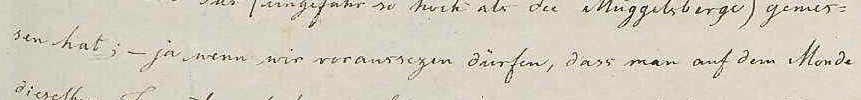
sen hat; – ja wenn wir voraussezen dürfen, dass man auf dem Monde
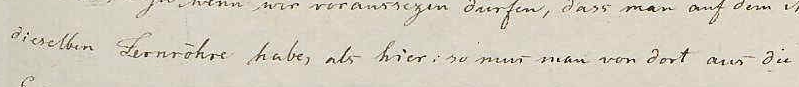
dieselben Fernröhre habe, als hier: so mus man von dort aus die
